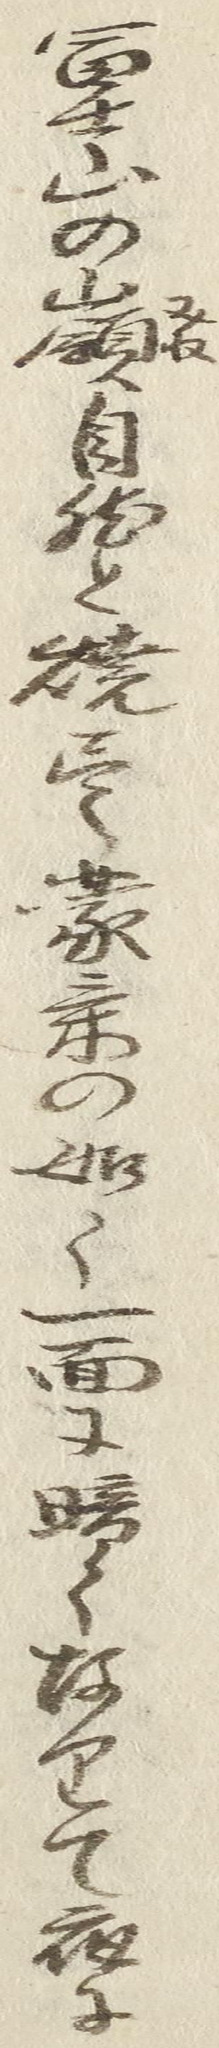冨士山の嶺自然と焼尽し蒙気の如く一面に暖くなりて夜に
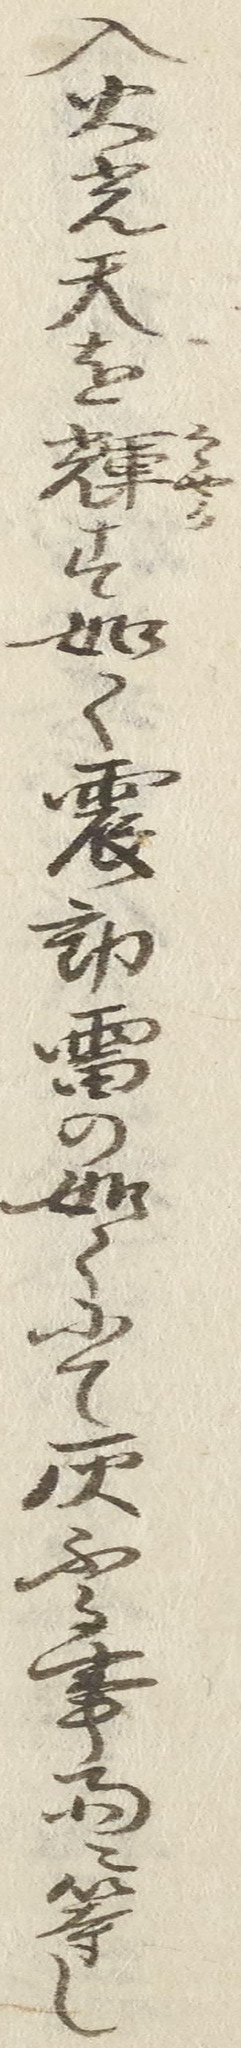入火光天を輝す如く震動雷の如くにて灰ふる事雨に等し
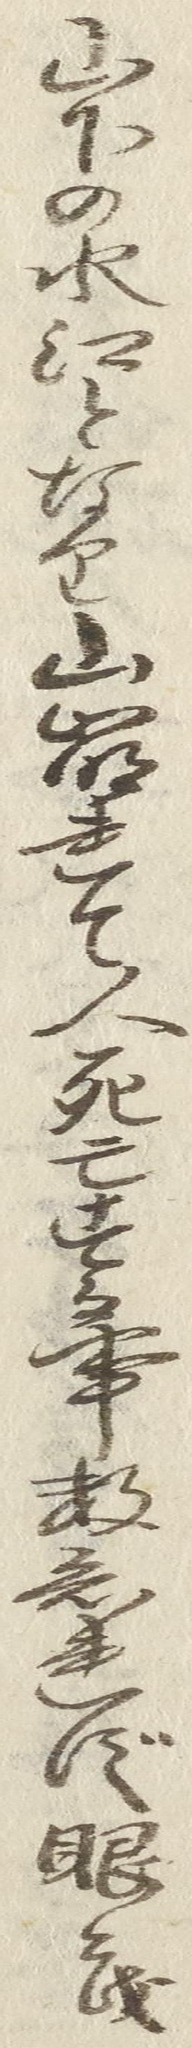山下の水江となり山崩れて人死亡する事数しれず眼にも
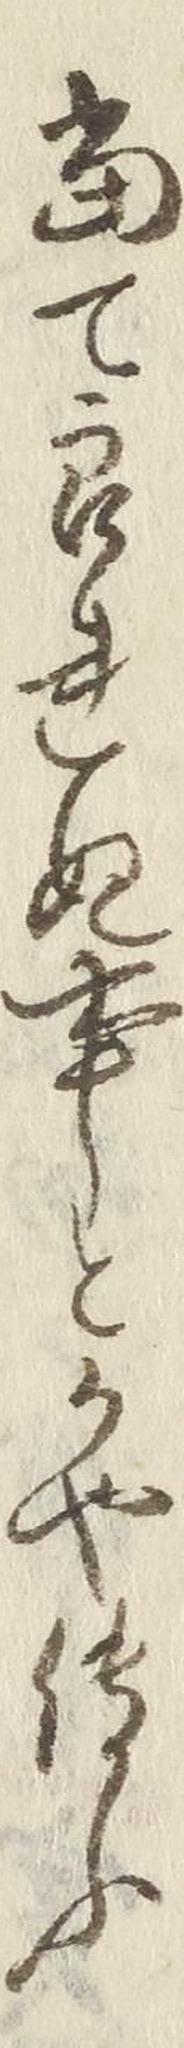当てられぬ事とかや伝ふ
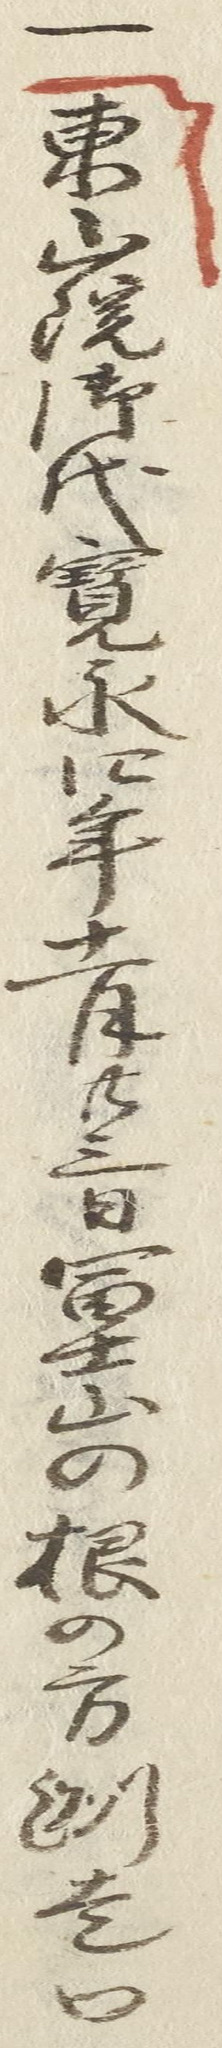一「東山院御代寛永四年十一月廿三日冨士山の根の方湖走口
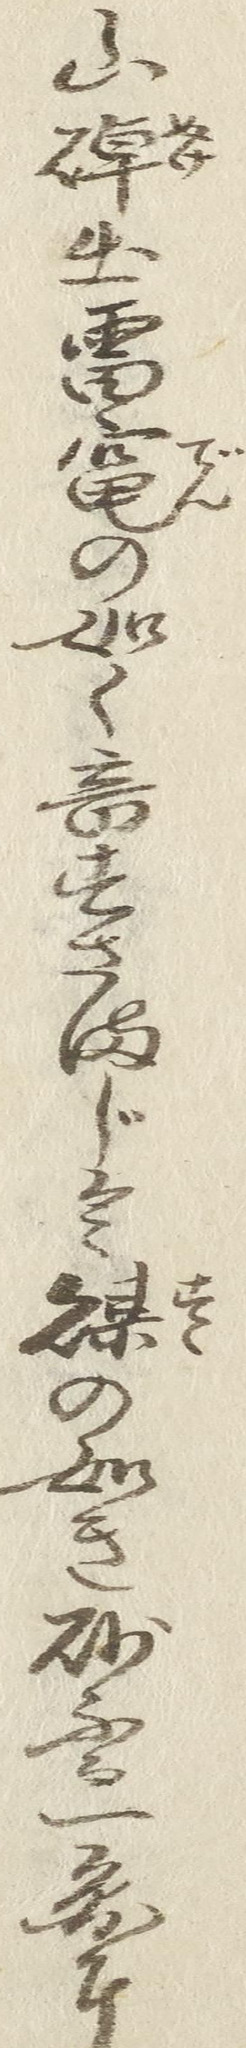山竨出雷電の如く音すさまじく煤の如き砂ふる一円に
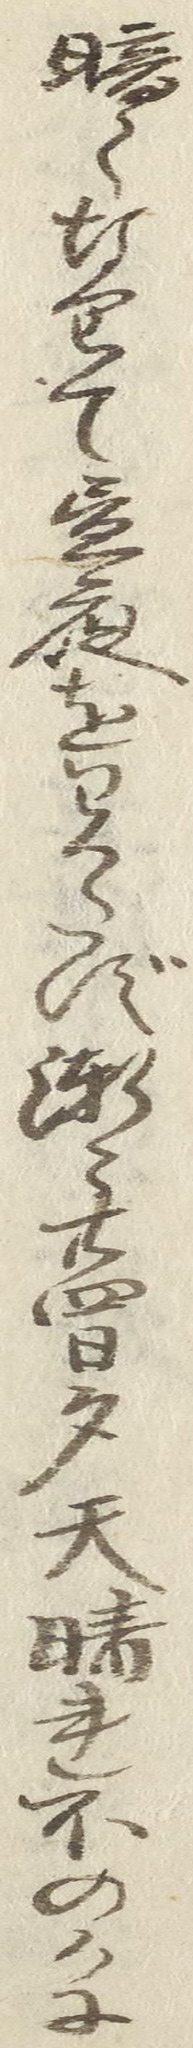暗くなりて昼夜をわかたず漸々廿四日夕天晴ほのかに
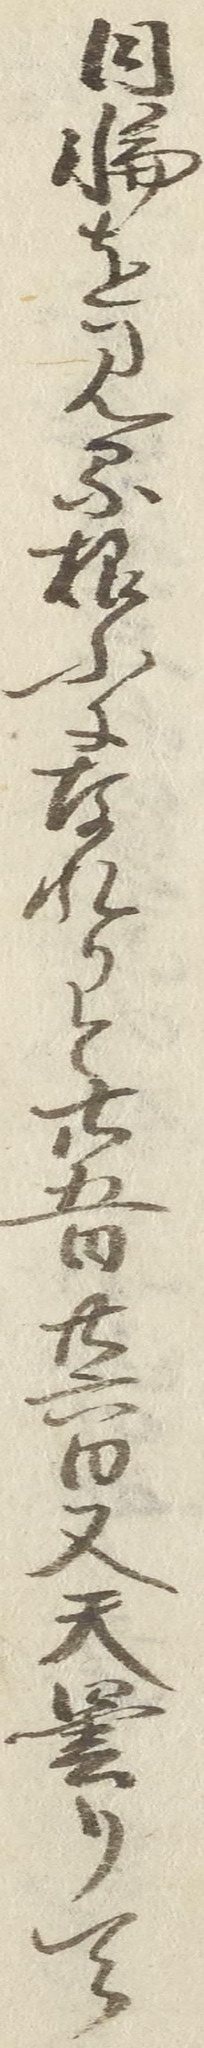日輪を見る様ふになれりと廿五日廿六日又天曇りて
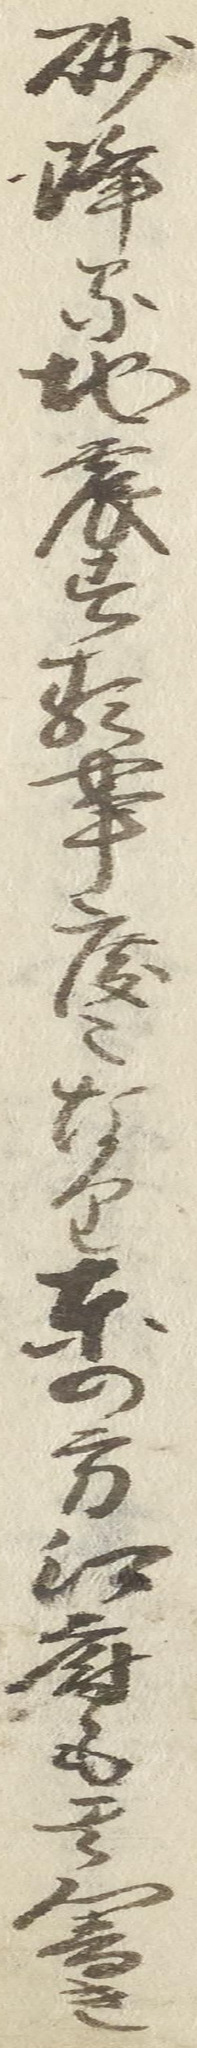砂降る地震する事度々なり東の方江府も其響き
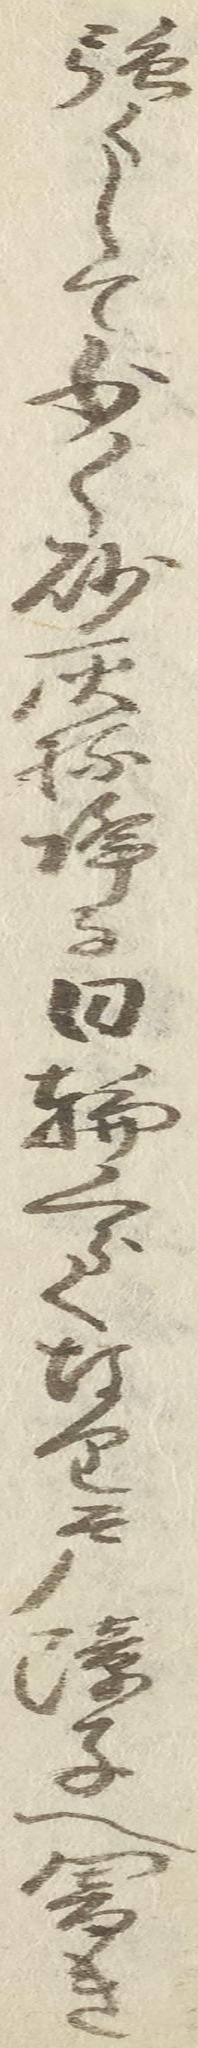強くして少々砂灰抔降る日輪くらくなり戸障子へ響き

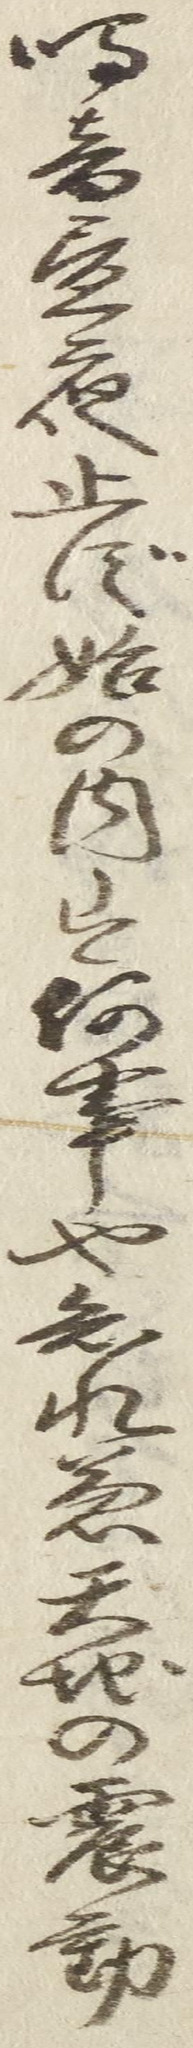鳴音昼夜止ず始の内は何事や知れ兼天地の震動
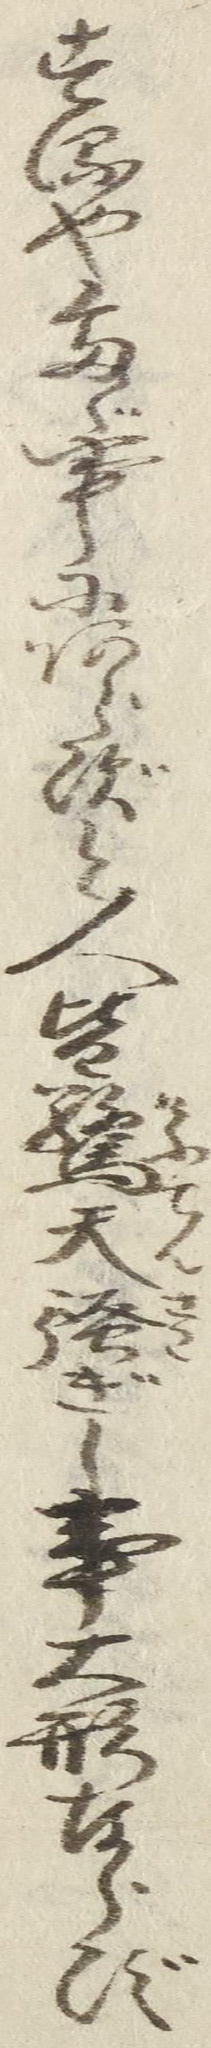するやたゞ事ならずと人皆驚天騒ぎし事大形ならず
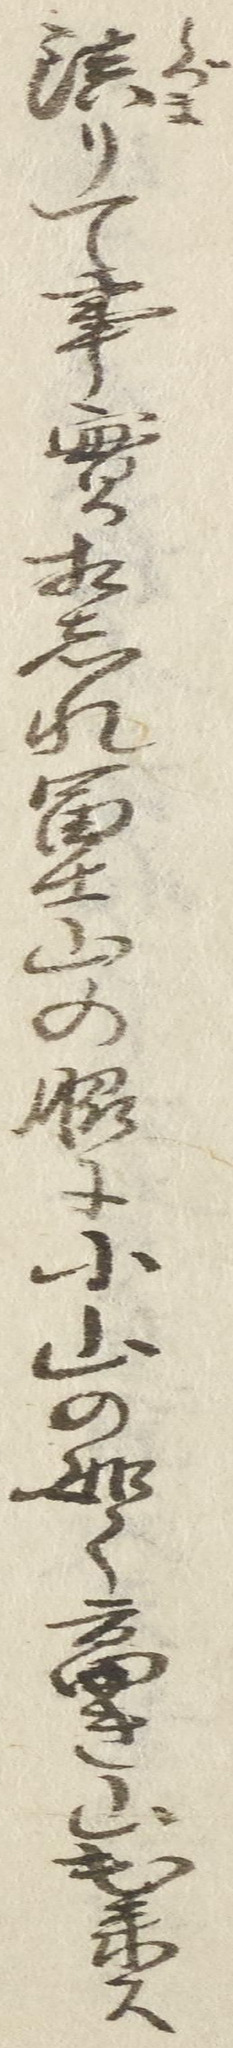鎮りて事実相しれ冨士山の脇に小山如く高き山出来す
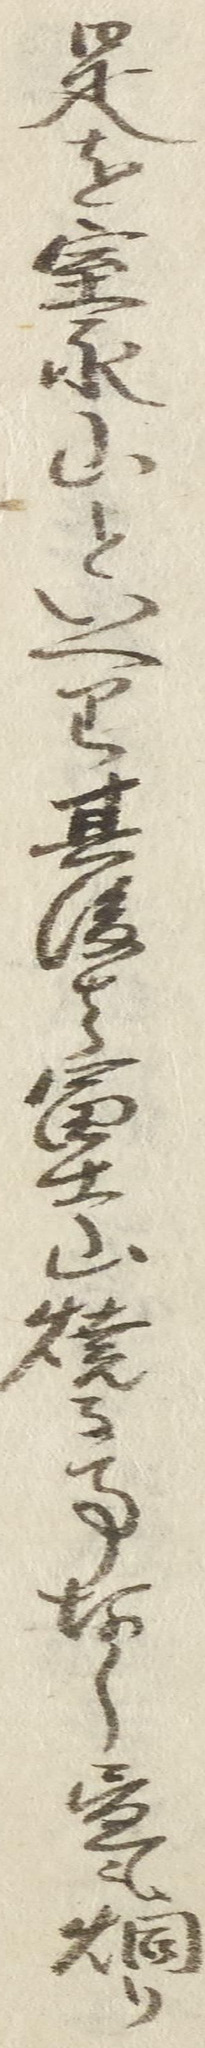是を室永山といへり其後は冨士山焼る事なく昼も烟り
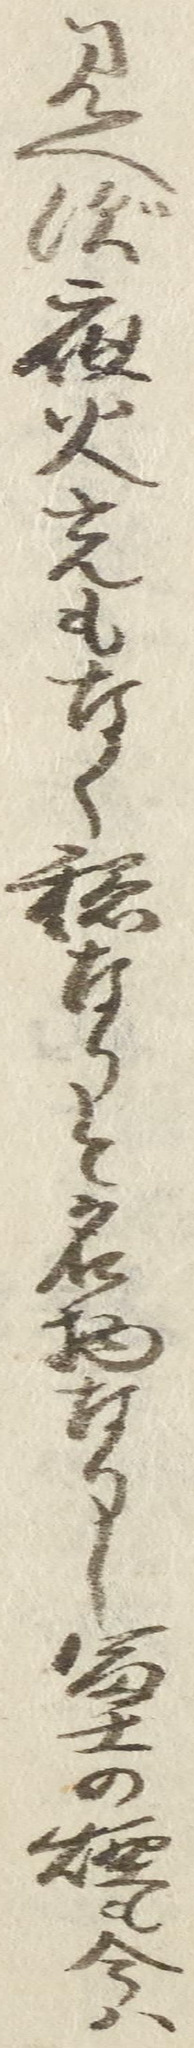見へず夜火光もなく穏なりと名物なりし冨士の煙も今は
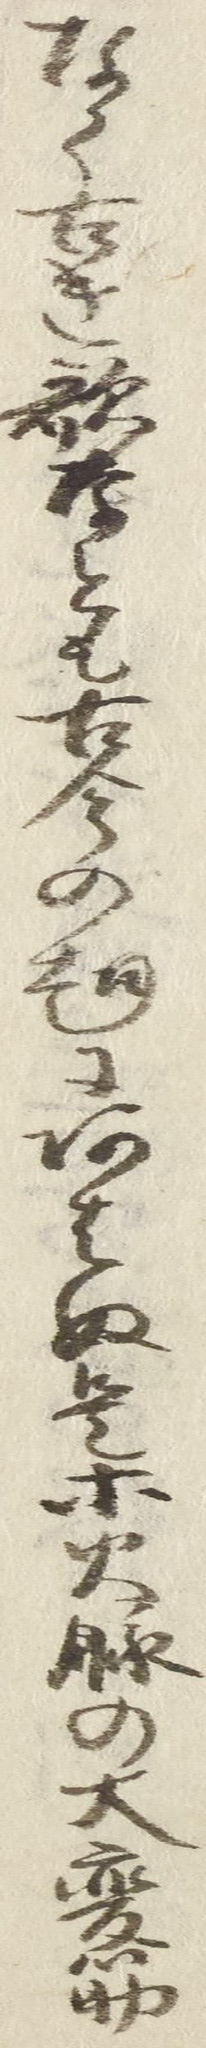なく古き欲なとも古今の趣にあはぬ是等火脈の大変筋
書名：従往古地震御届書記誌之一
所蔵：東京大学地震研究所図書室 Earthquake Research Institute Library, The University of Tokyo, JAPAN
